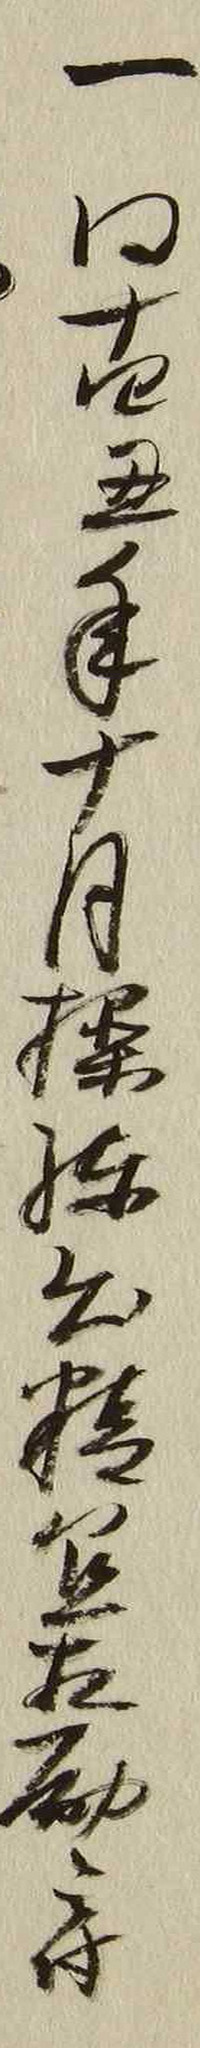一同十四丑年十月操練出精宜相励候ニ付
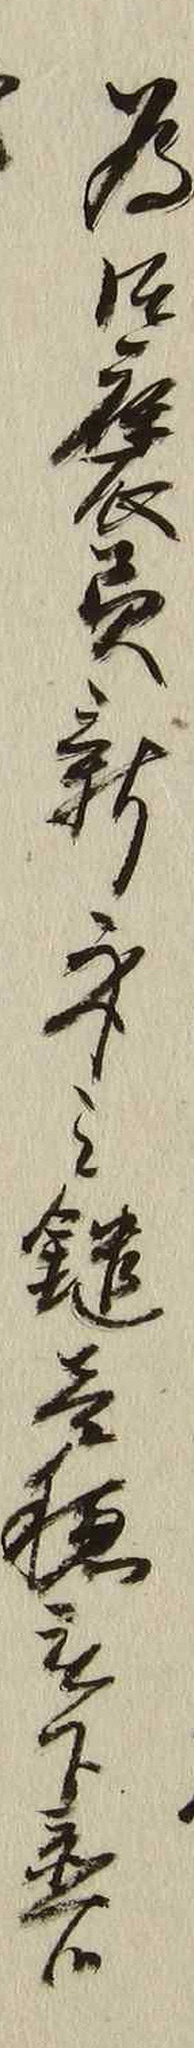為御褒美新身之鑓壱穂被下置候
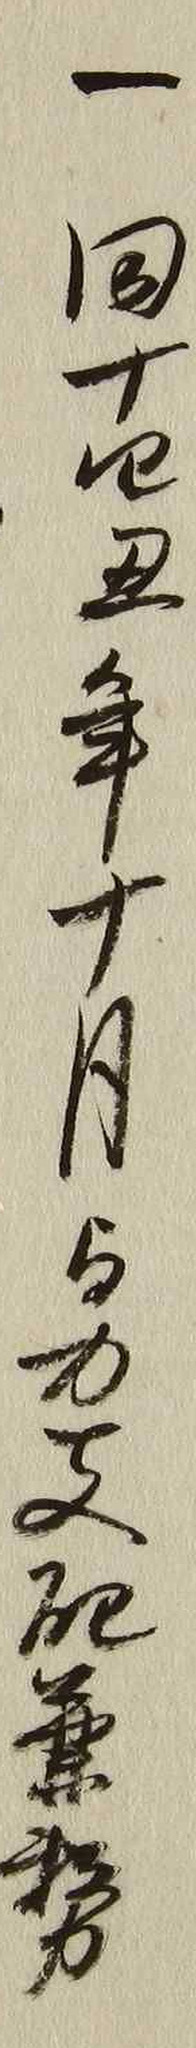一同十四丑年十月与力支配兼務
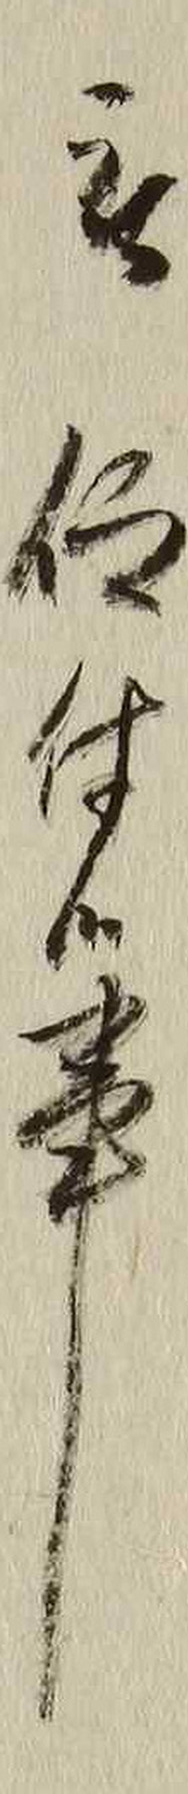被仰付候事
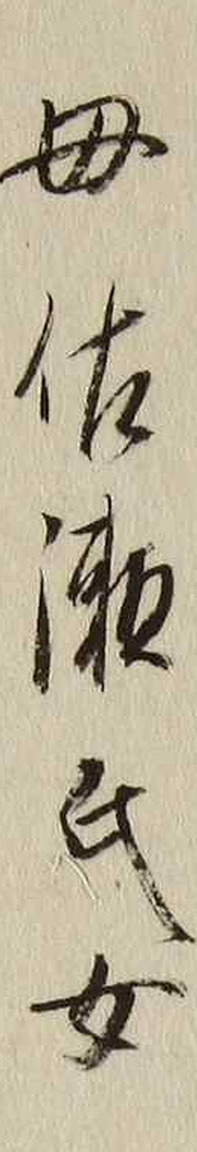母佐瀬氏女
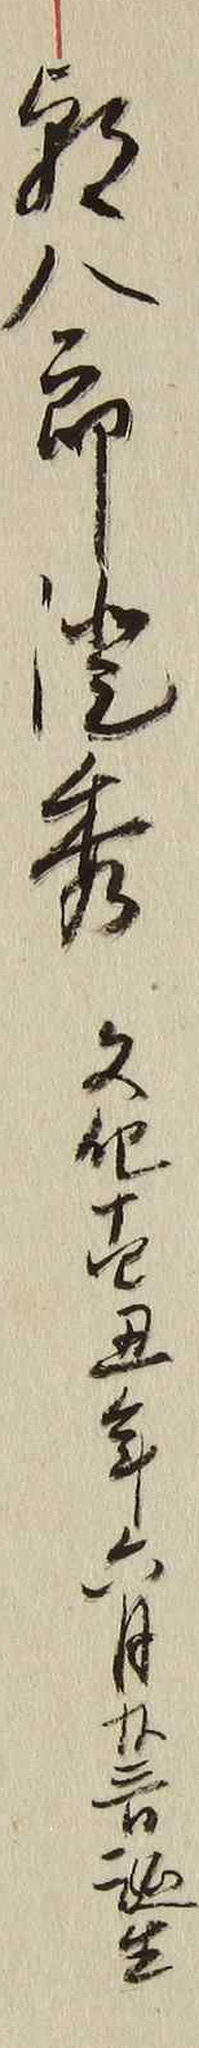朝八郎澄秀文化十四丑年六月廿三日誕生
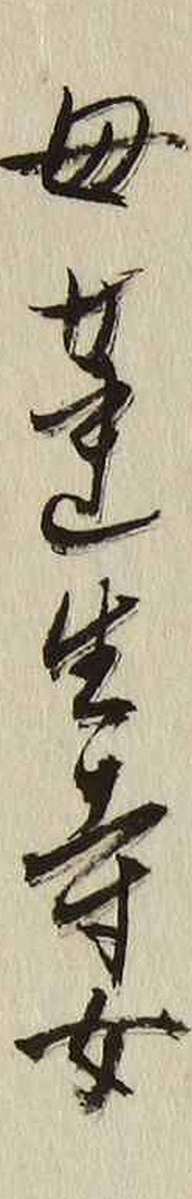母蓮生寺女

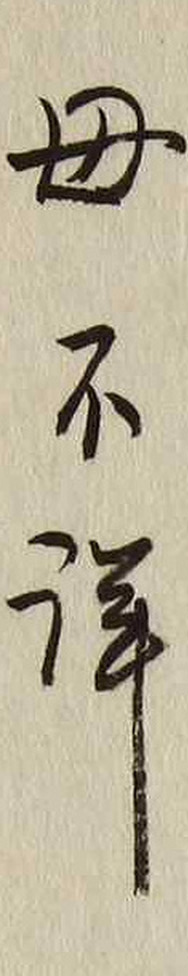母不詳
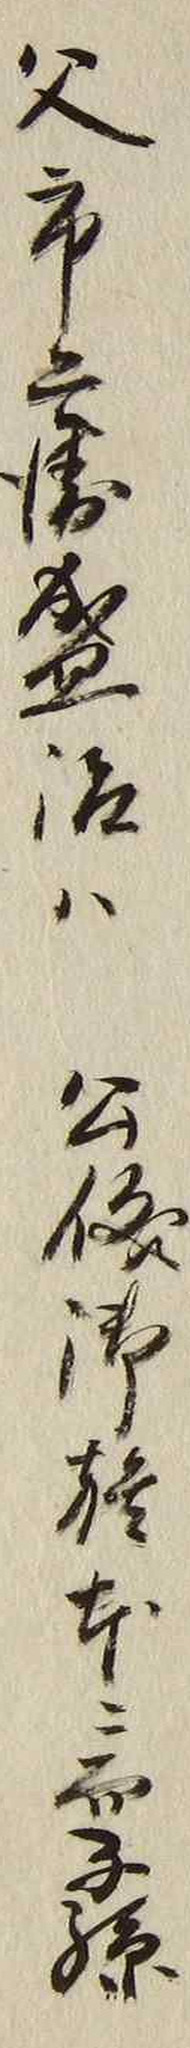父市兵衛盛治ハ公儀御旗本ニ而子孫
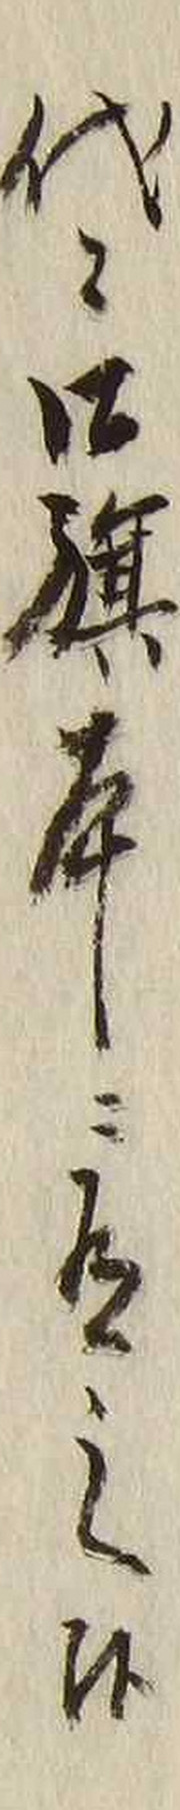代々御旗本ニ有之候

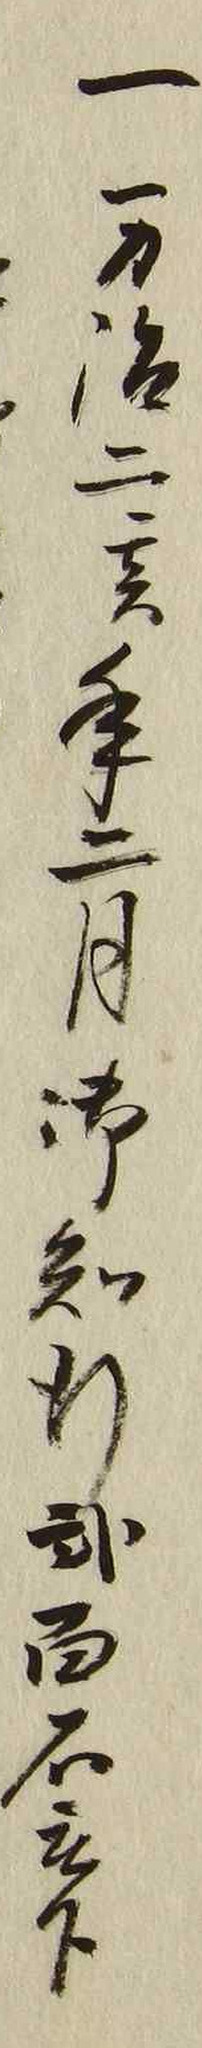一万治二亥年二月御知行弐百石被下
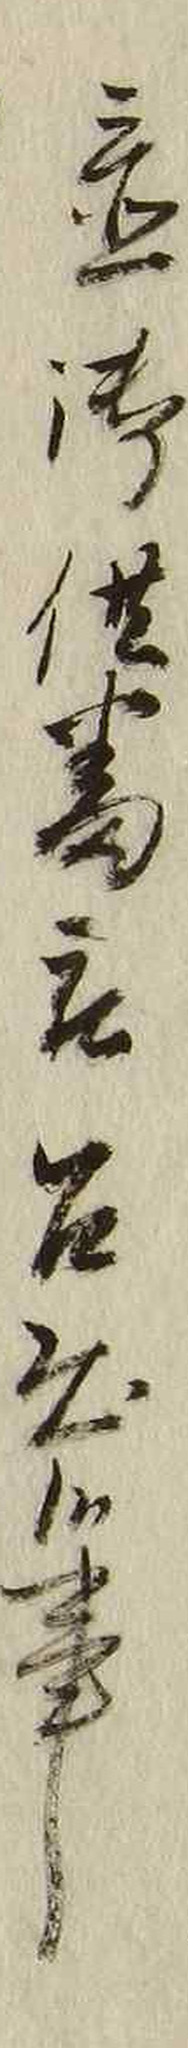置御供番被召出候事
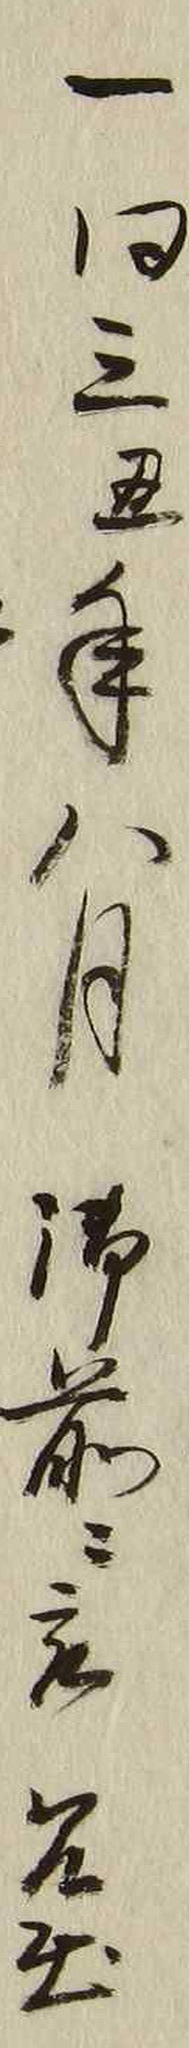一同三丑年八月御前ニ被召出
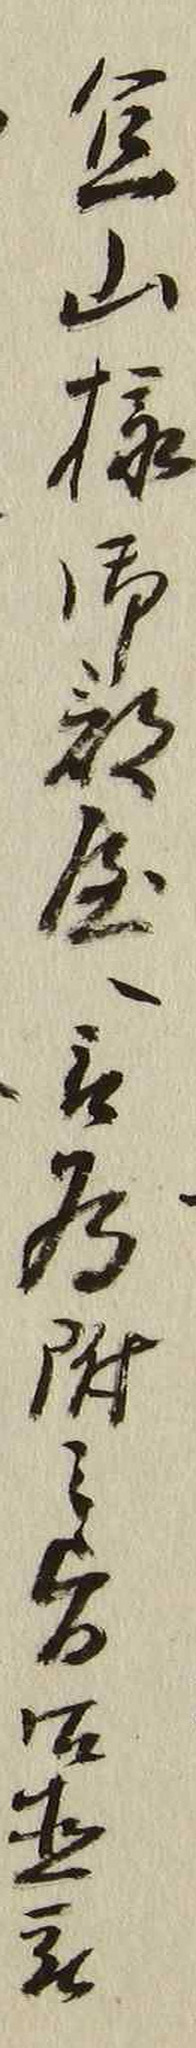宣山様御部屋へ被為附之旨御直被
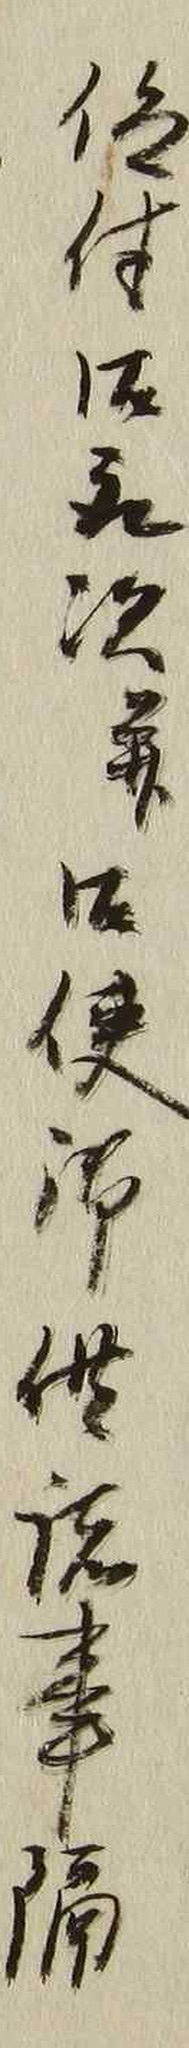仰付御取次并御使御供諸事隔
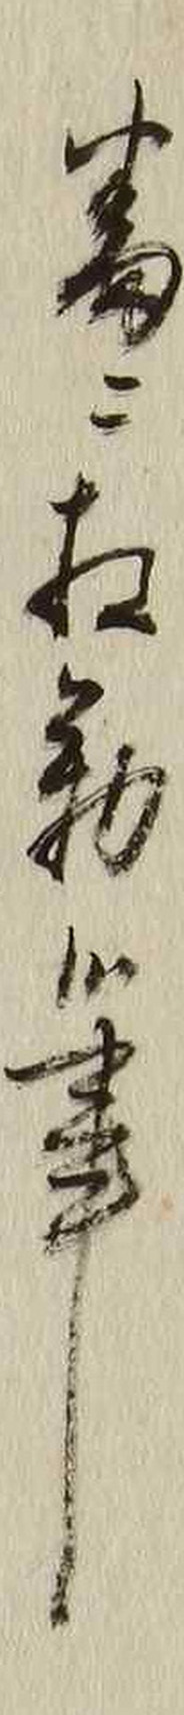番ニ相勤候事
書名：諸士系譜　巻之349　も之部5
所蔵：会津若松市立会津図書館
